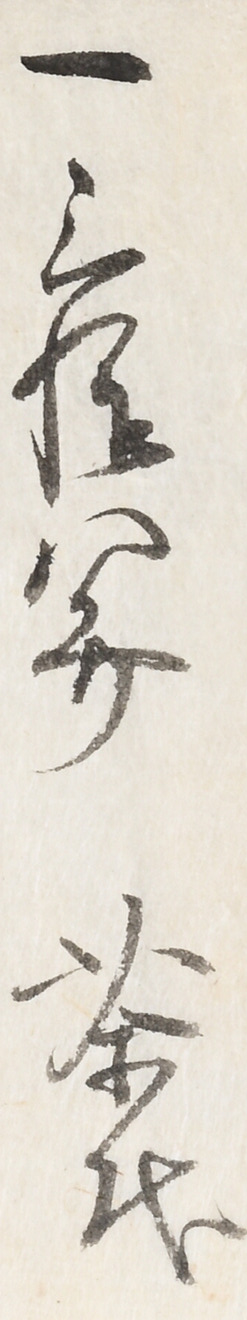一三拾八文茶代
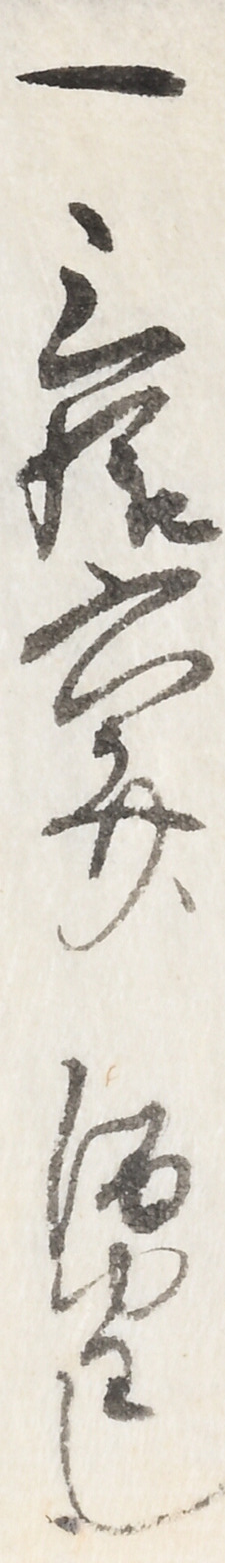一三拾六文酒ゆわし
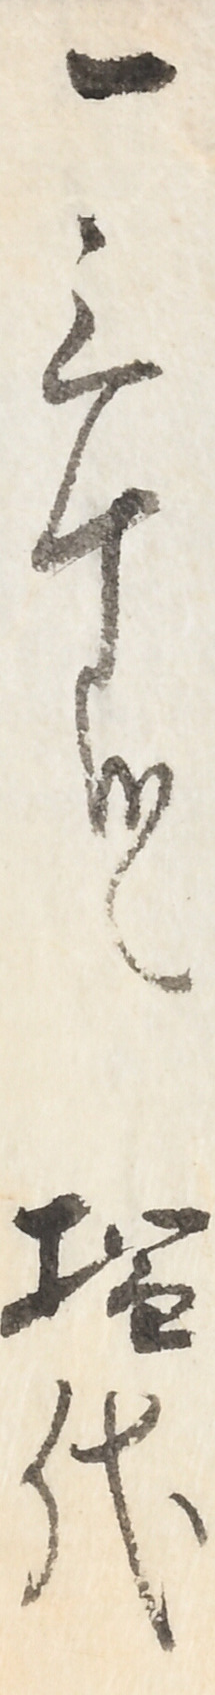一三十弐文塩代

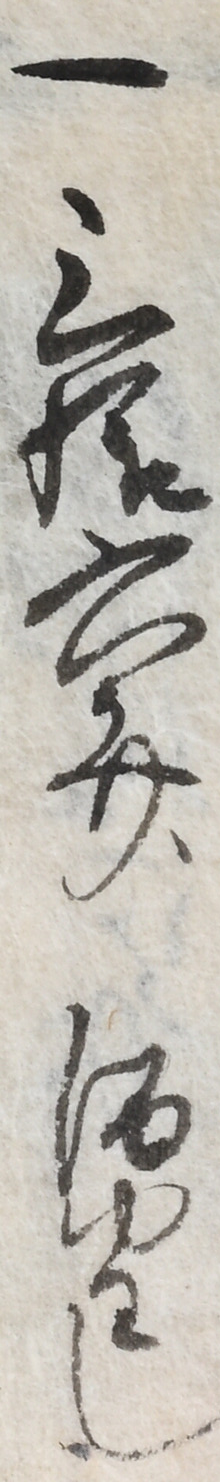一三拾六文酒代
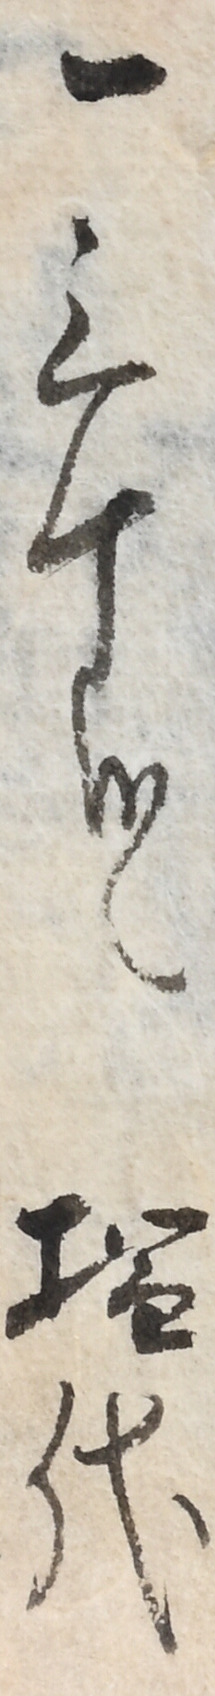一三拾弐文塩代
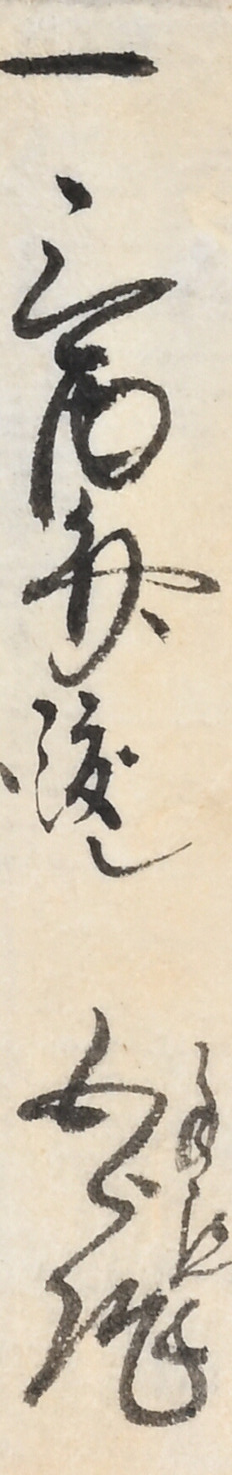一三百文渡し五郎作
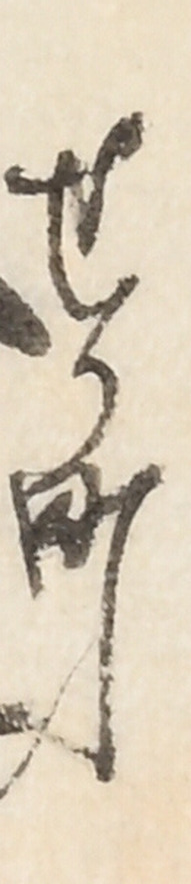せり町
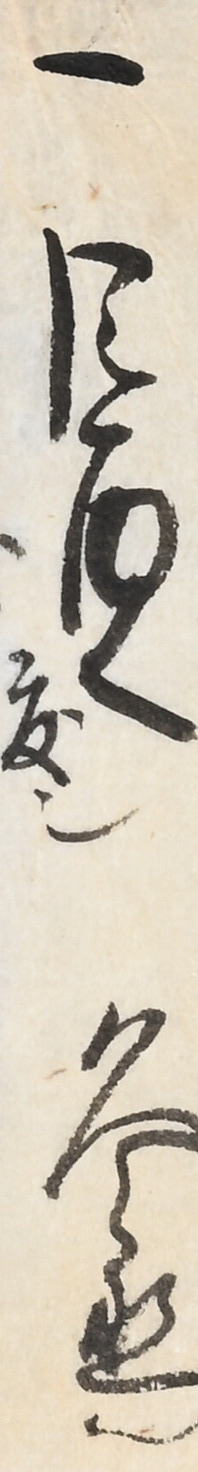一四百文久之丞殿
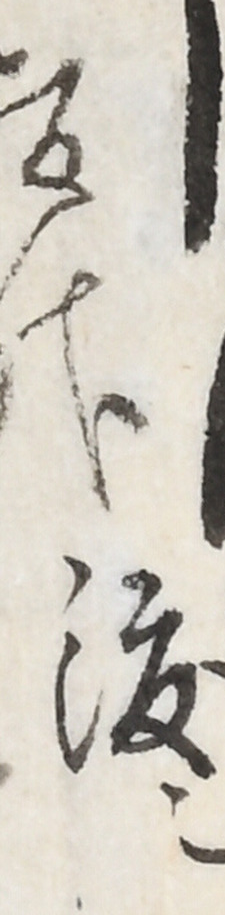板代渡し
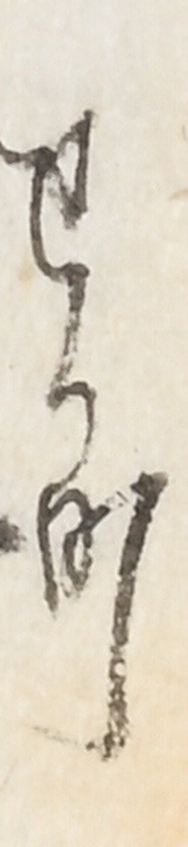せり町
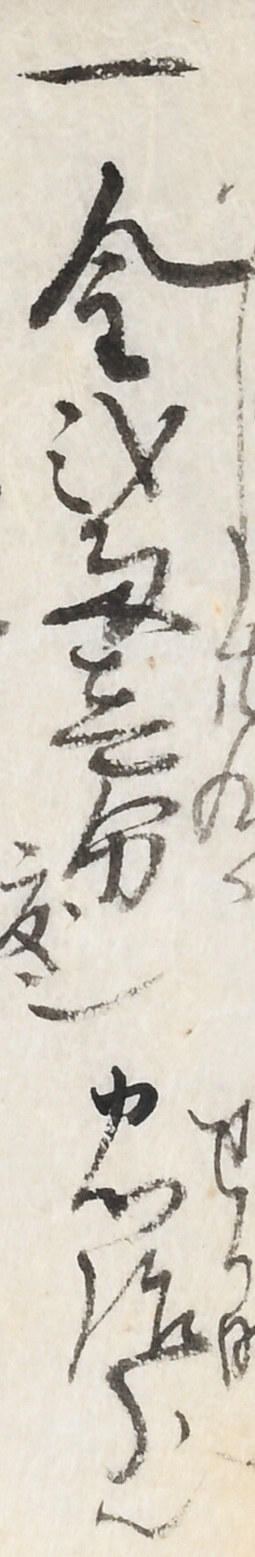一金弐両壱分忠治郎殿
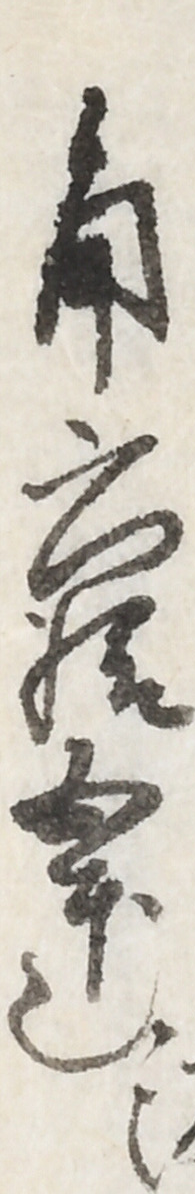角六拾五本也
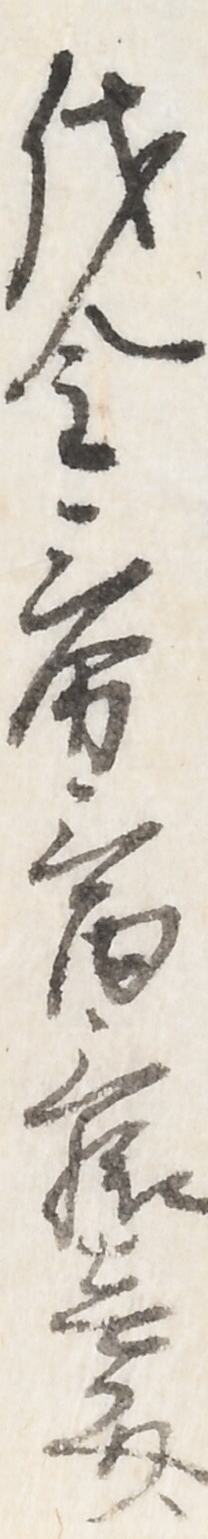代金三分三百三拾壱文
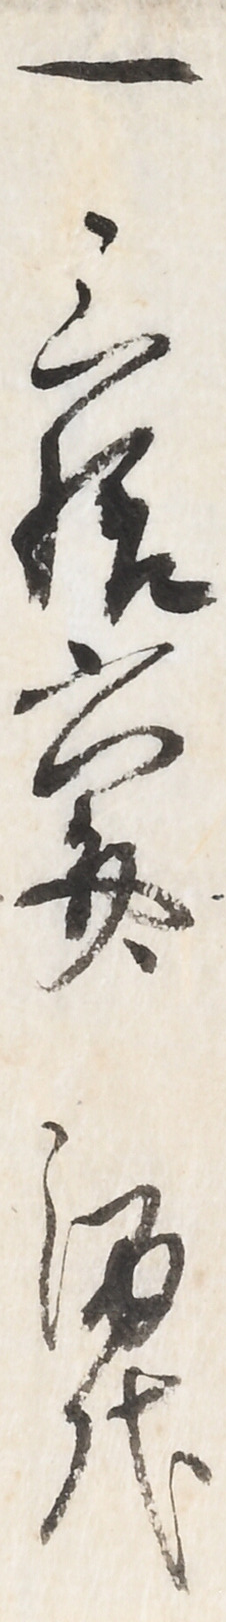一三拾六文酒代
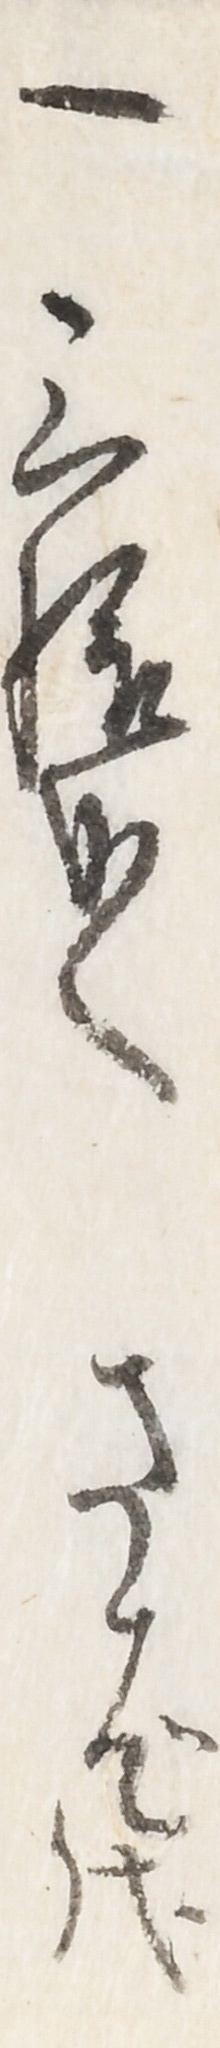一三拾弐文さば代

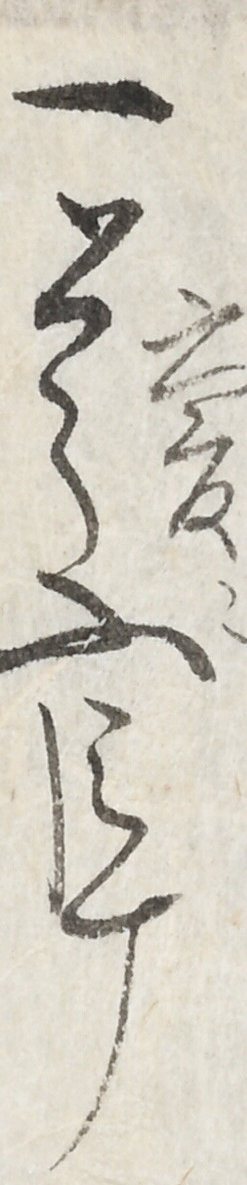一とうふ四丁
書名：合力覚帳
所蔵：伊那市立高遠町図書館・合同会社AMANE
